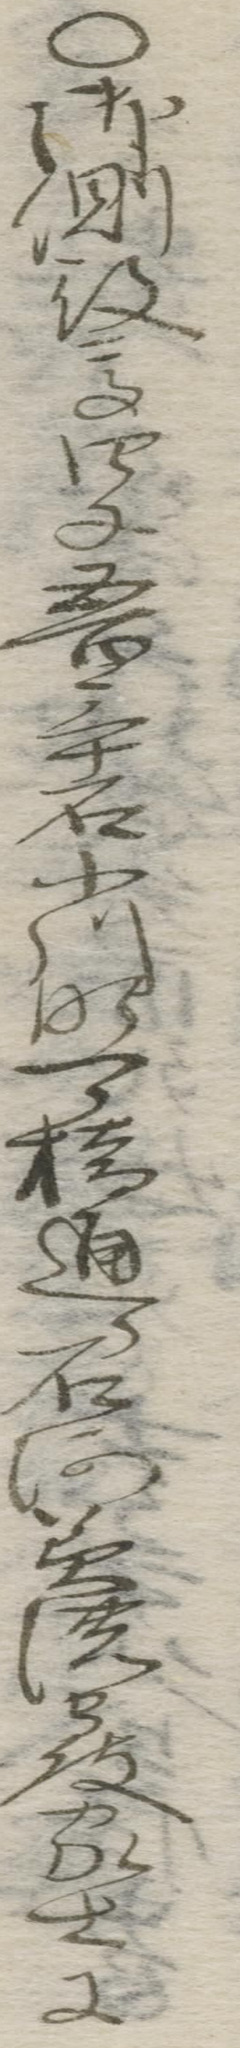○御側役高四千五百三十石小川町一つ橋通り石河美濃守殿家士に
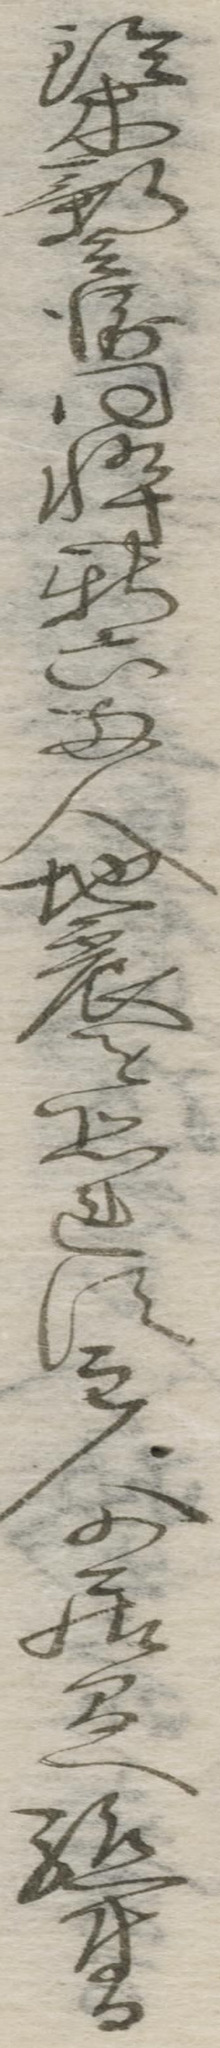鈴木新兵衛同悴新六両人地震を恐れす主人の居間へ駆付る
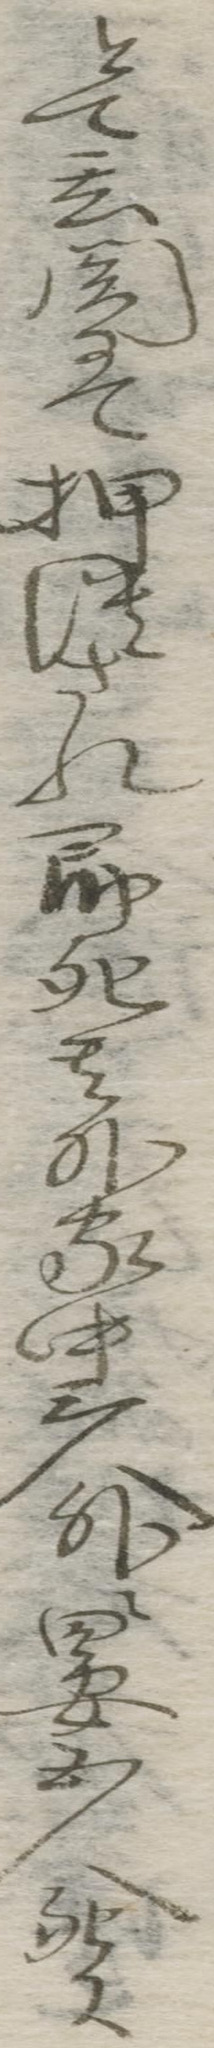とて玄関にて押潰され即死其外家中三人外ニ男女五人死ス
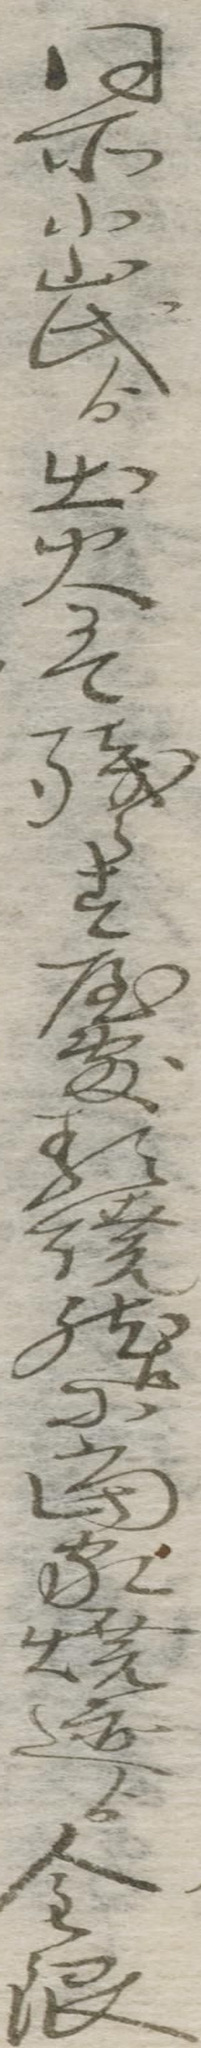同所小山氏ゟ出火にて残らす屋敷類焼然ルに当家焼迹ゟ金銀
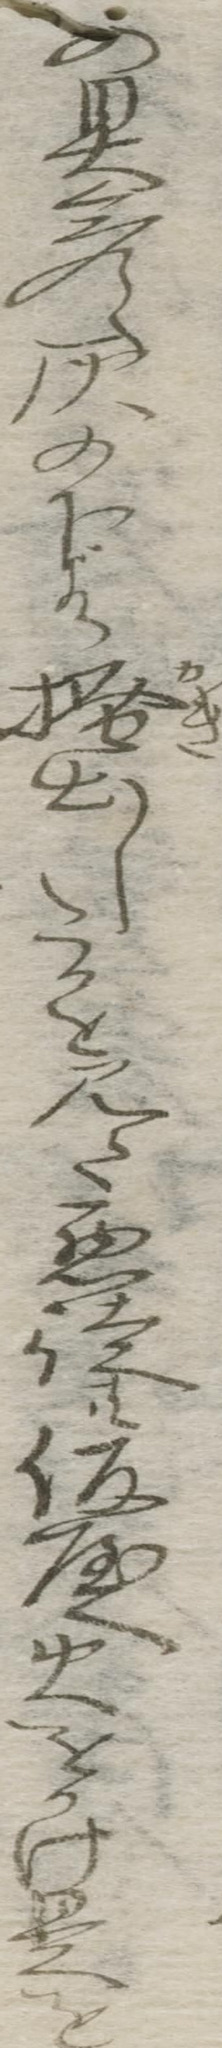の具多く灰の下より掻出したるを見て悪徒共仮屋へ火をかけ是を
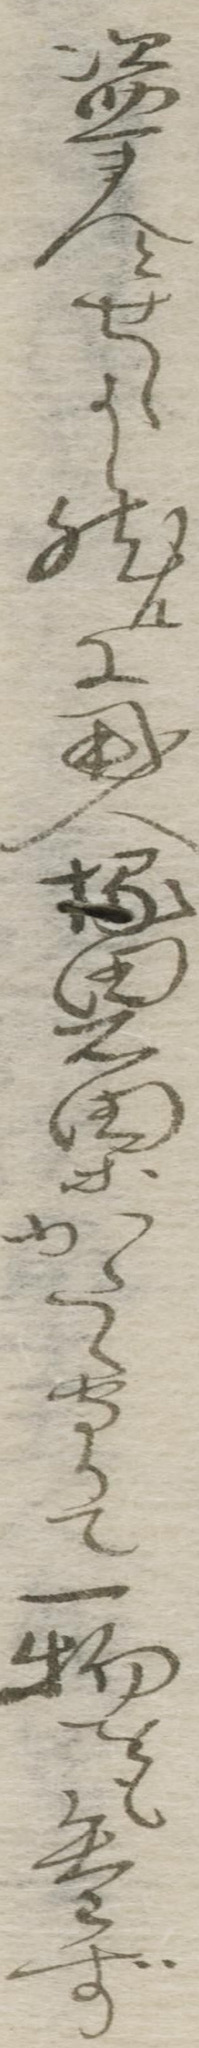盗まんとせしよし然ルに用人堀田石田等かたく守りて一物をも失わず

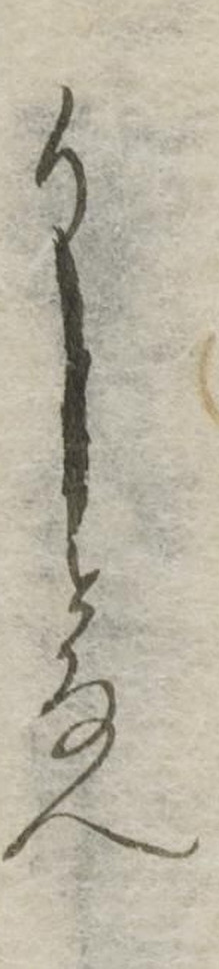かしとなん
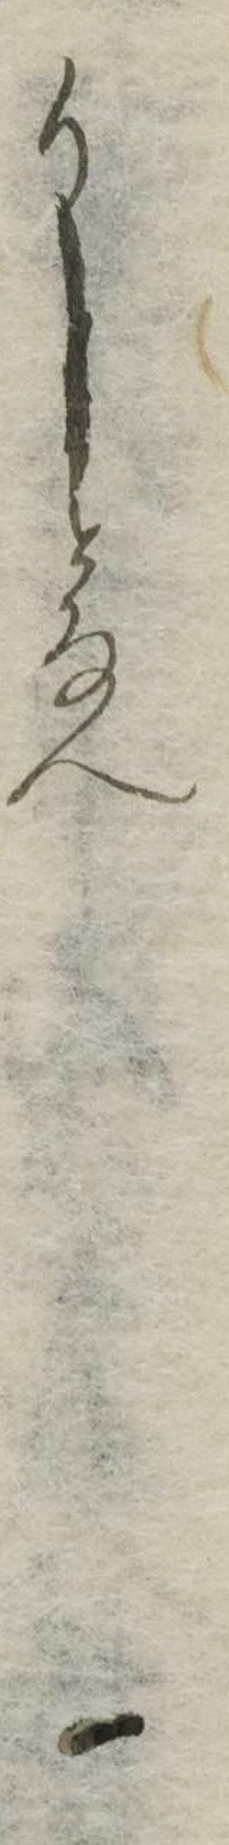かしとなん
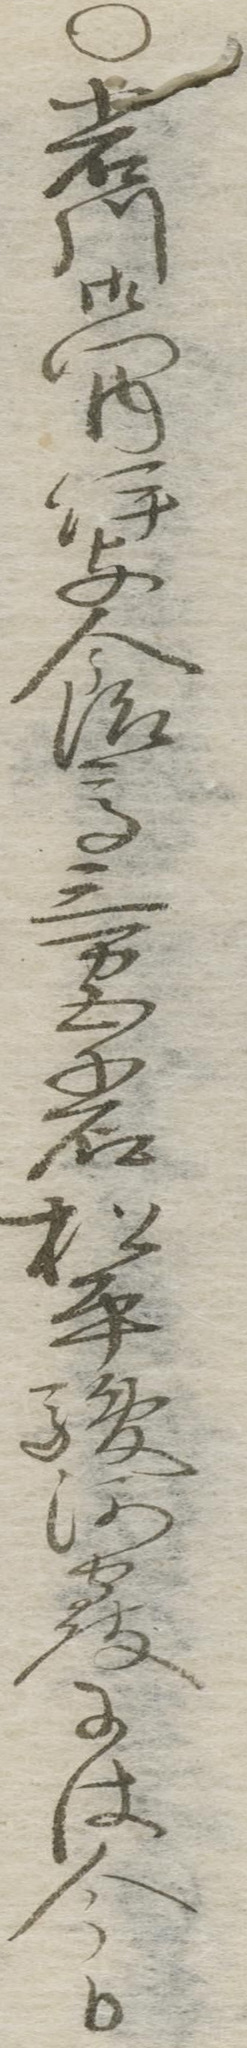○小石川御門内伊与今治高三万五千石松平駿河守殿には今日
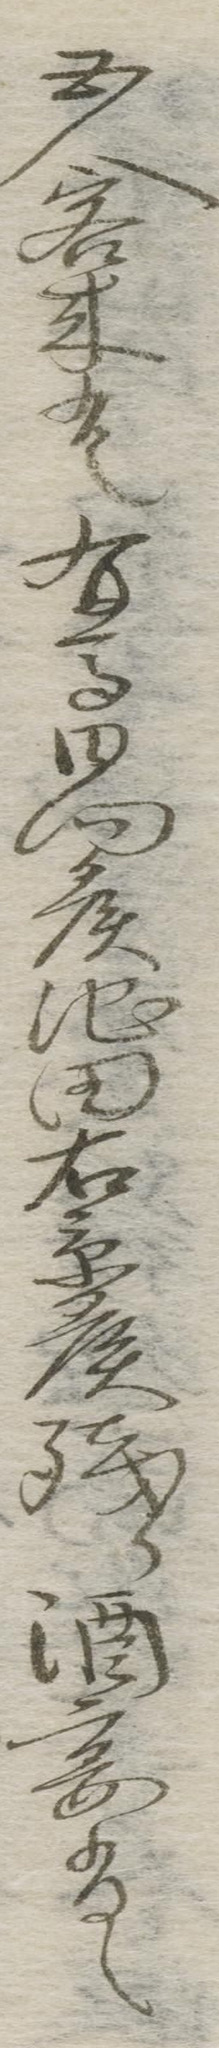五人客来有之有馬日向侯池田右京侯残り酒宴有之
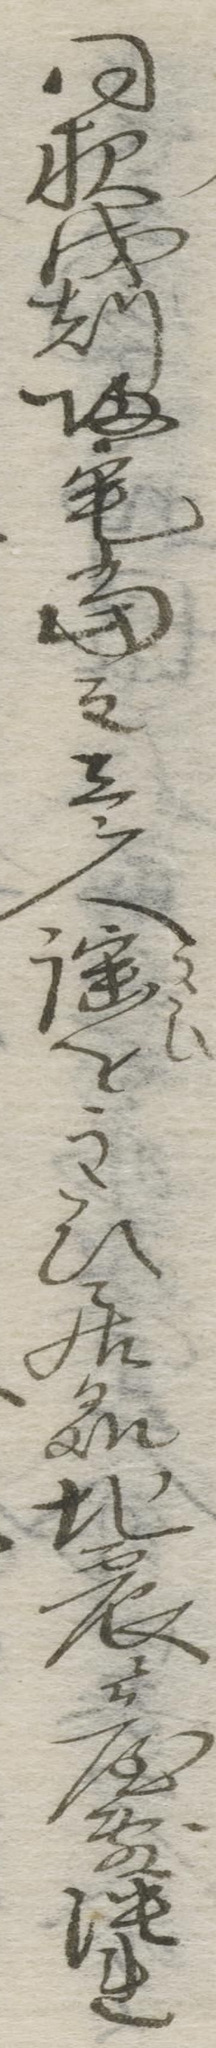同夜戌刻帰宅当主壱人謡をうたひ居る処地震ニ而屋敷潰れ
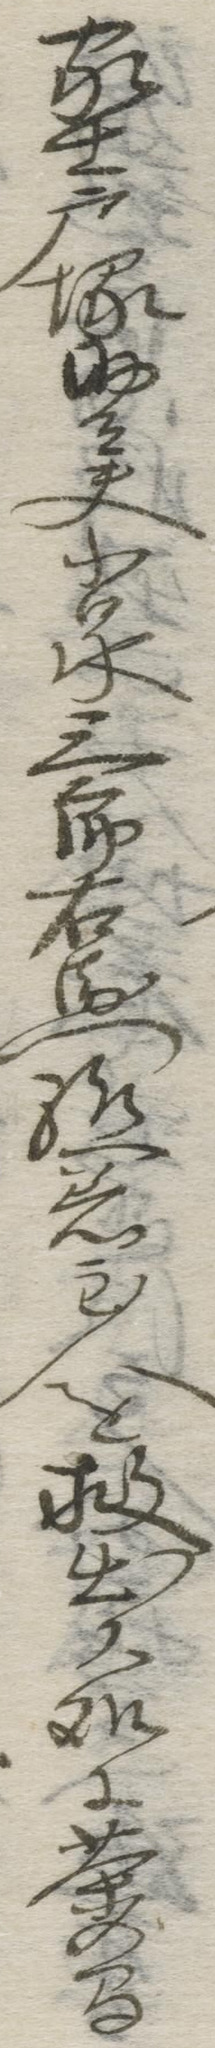家士戸塚助太夫小泉三郎右衛門駆着主人を救出ス処に茶の間
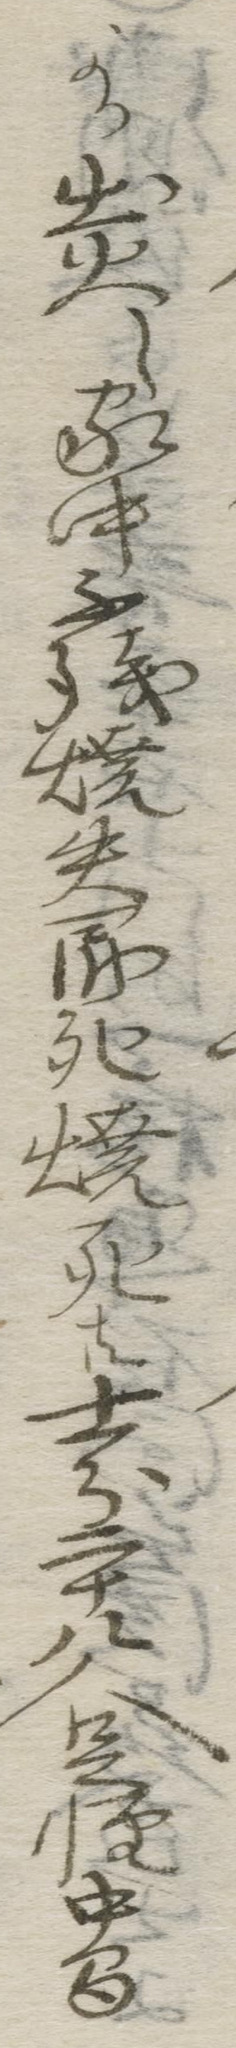より出火し家中不残焼失即死焼死者士分二十八人足軽中間
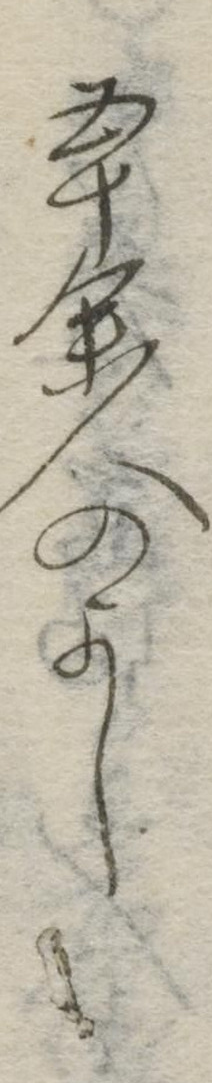五十余人のよし
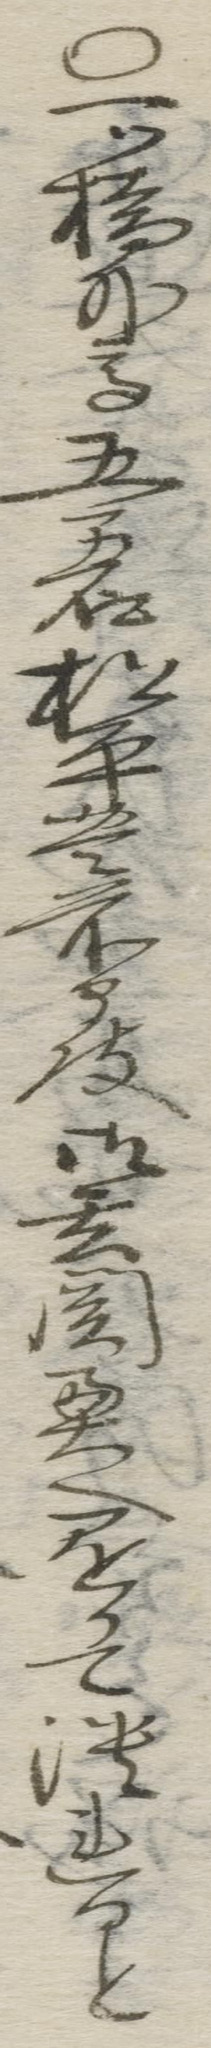○一ツ橋外高五万石松平豊前守殿御玄関奥へ懸りて潰れると
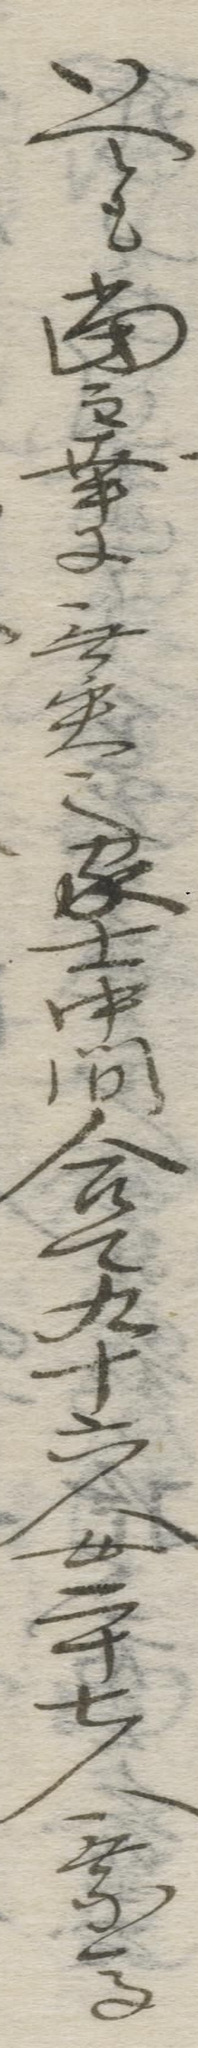いへとも当主幸に無災也家士中間合て九十六人女二十七人乗馬
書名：江戸中諸屋敷　地震竒談録
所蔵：東京大学地震研究所図書室 Earthquake Research Institute Library, The University of Tokyo, JAPAN
